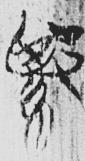○（堅）
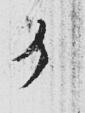人
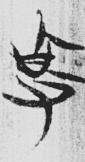史（使）
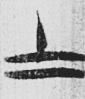士
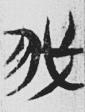我
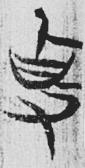史（使）
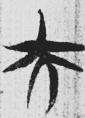大
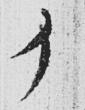人
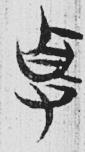史
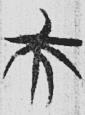大夫
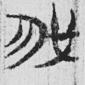我
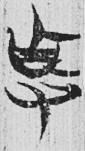史（使）
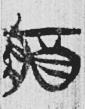𨟻（將）
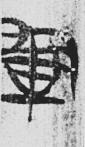軍
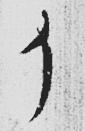人
